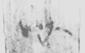廿
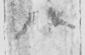八
